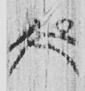吳（餘）
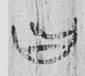曰
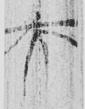夫
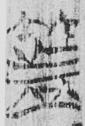箸者
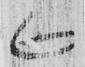㠯（以）
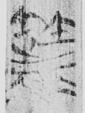箸（著）
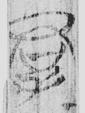君子
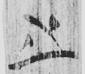之
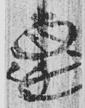惪（德）
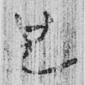也
